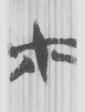尒
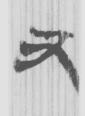又
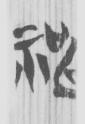神
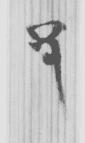邑
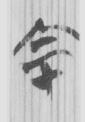{宀主}
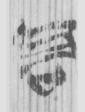{㠯ㅋ}
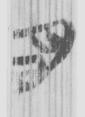明
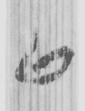㠯（以）
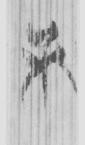某
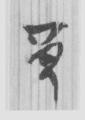邑
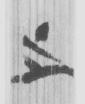之
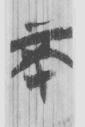不
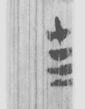十三
